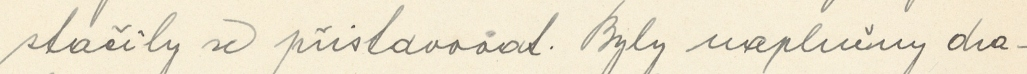stačily se přistavovat. Byly naplněny dra-
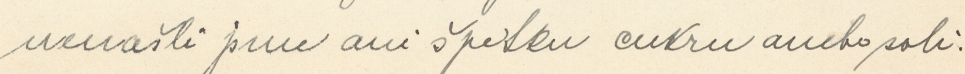nenašli jsme ani špetku cukru anebo soli.
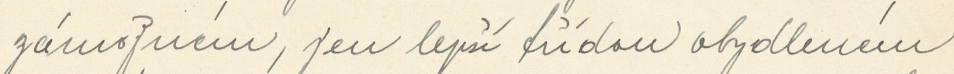zámožném, jen lepší třídou obydleném
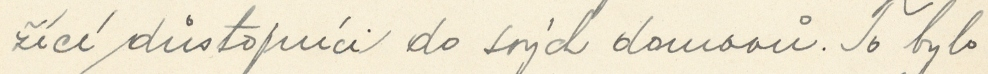žící důstojníci do svých domovů. To bylo
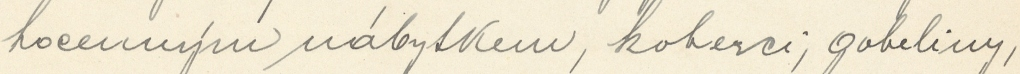hocenným nábytkem, koberci, gobeliny,
